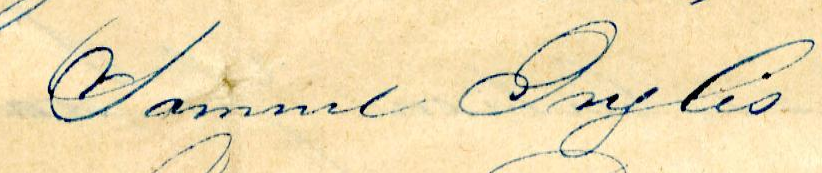Samuel Inglis
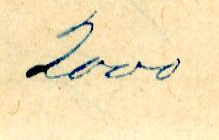2000
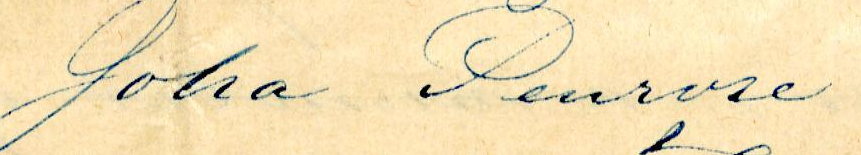John Pearse
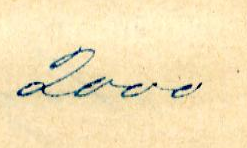2000
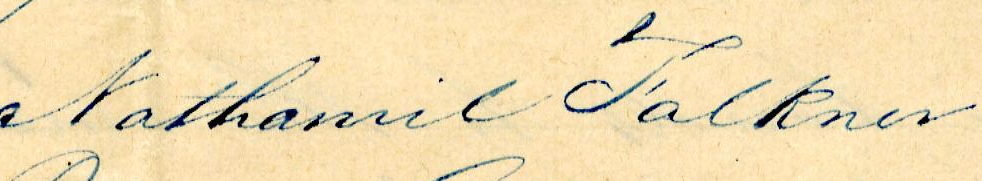Nathaniel Falkner
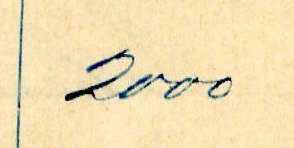2000
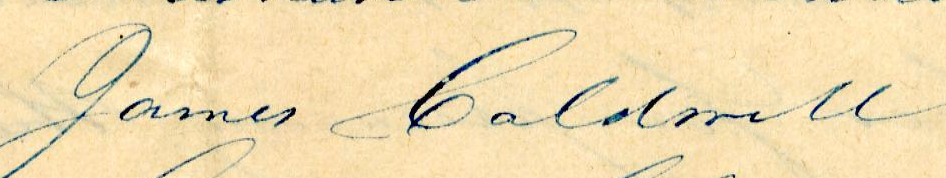James Caldwell
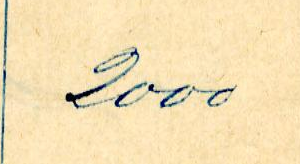2000
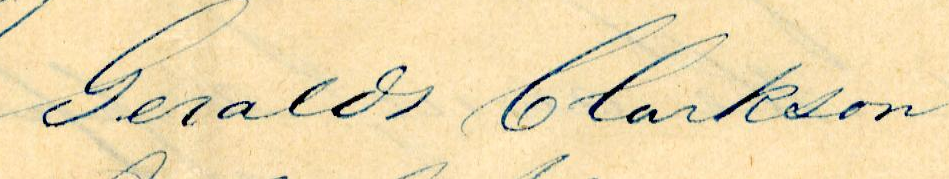Gerald Clarkson
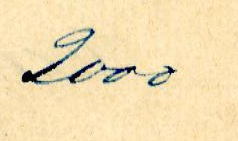2000
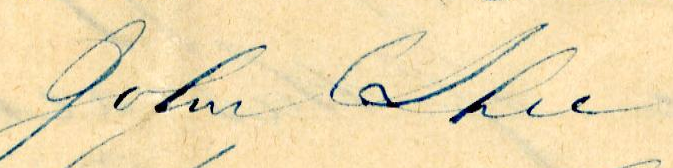John Shee
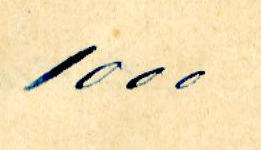1000
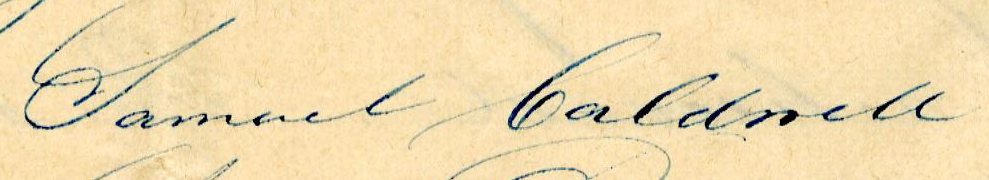Samuel Caldwell
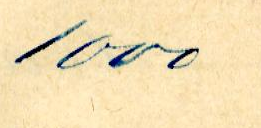1000
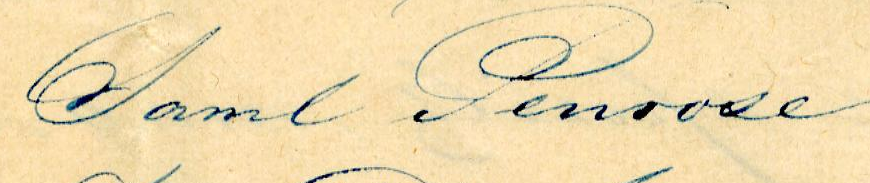Saml Penrose
